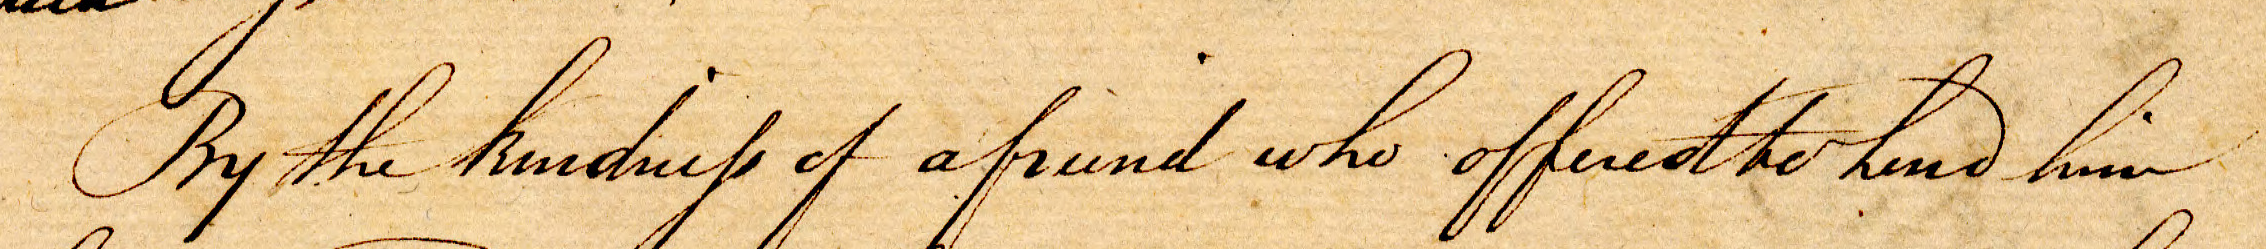By the kindness of a friend who offered to Lend him
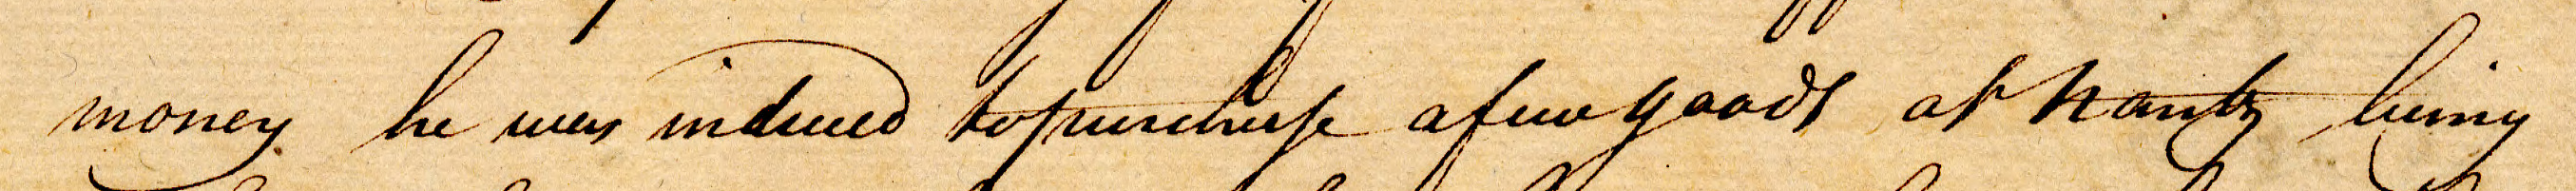money. he was induced to purchase a few goods at Nantz being
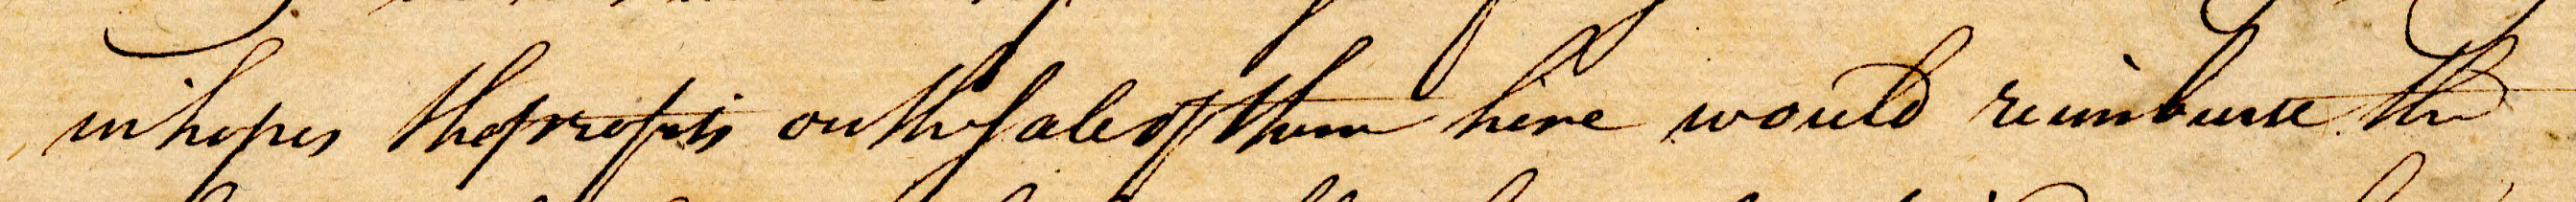in hopes the profits on the sale of them here would reimburse the
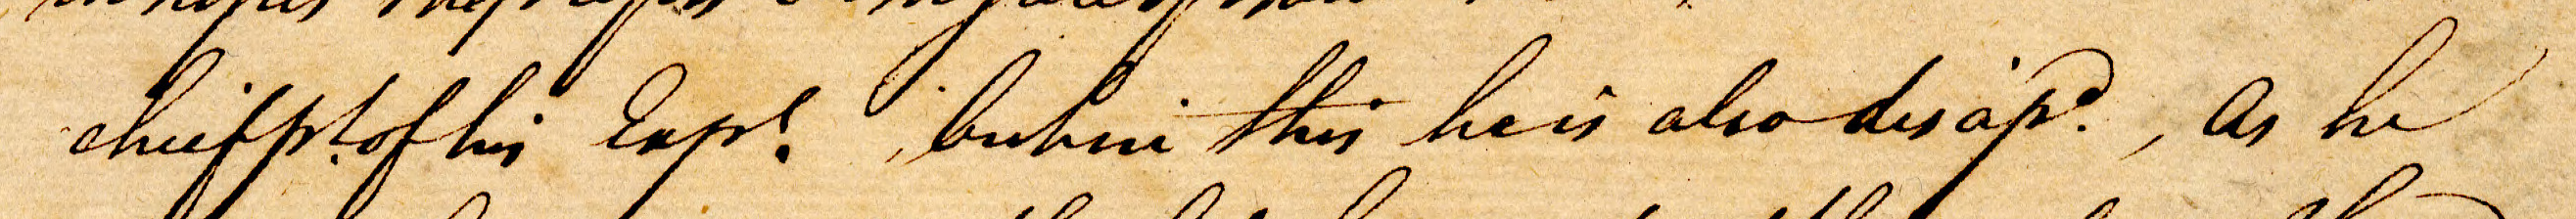chief p^t. of this Exp^s. but in this he is also disap^d., as he
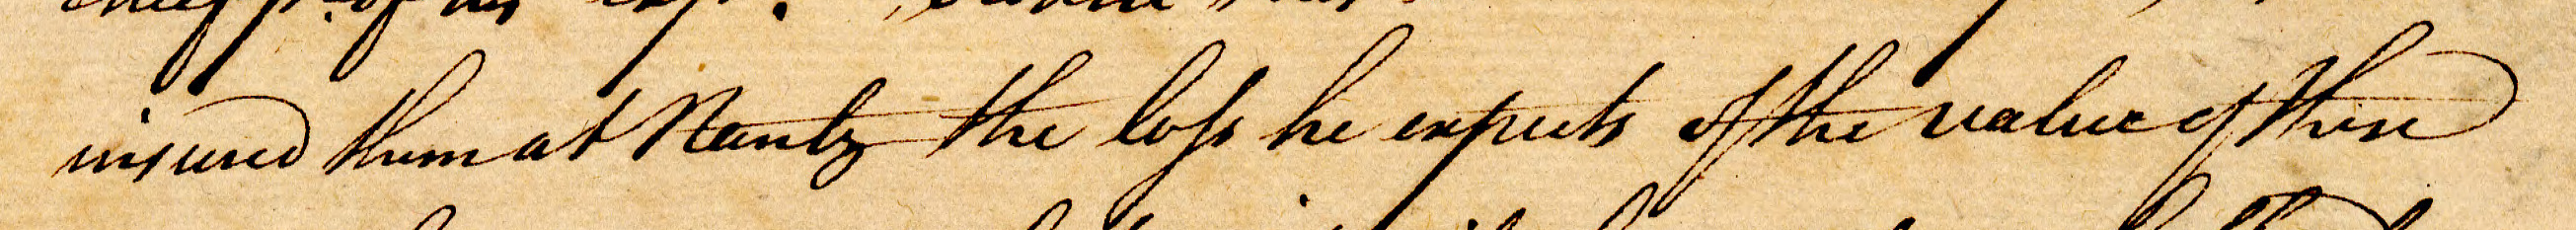insured them at Nantz the loss he expects of the value of these
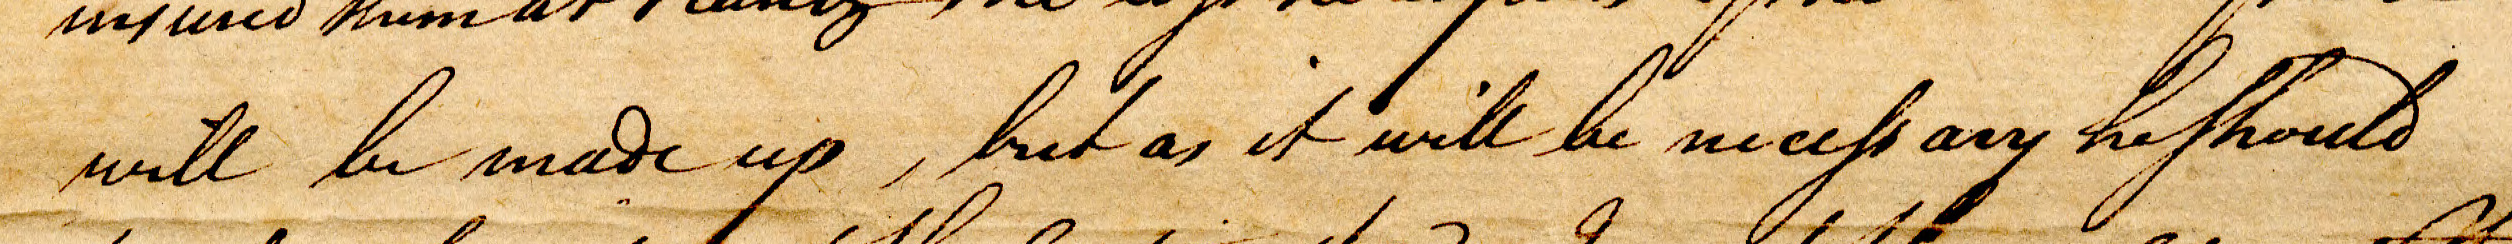will be made up, but as it will be necessary he should
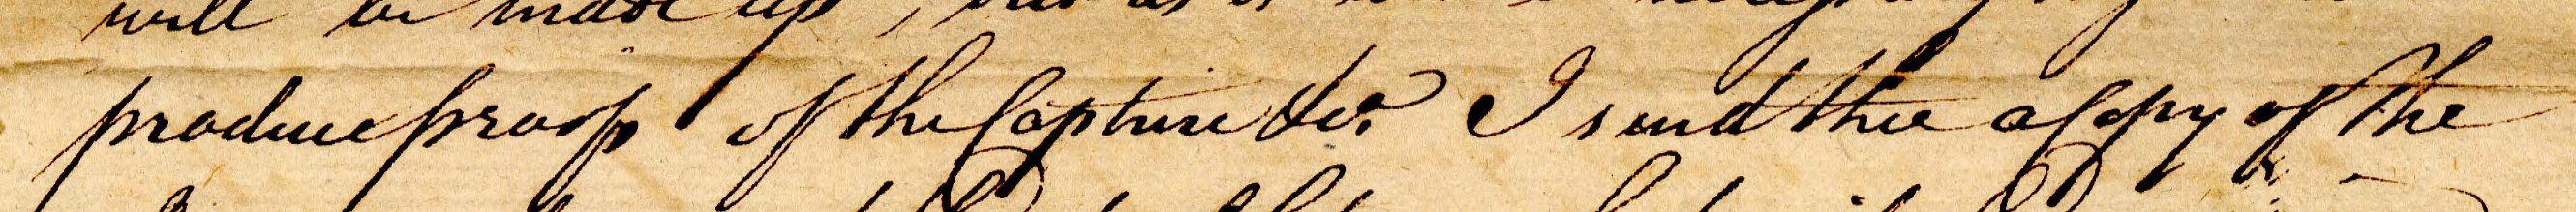produce proof of the Capture &c^a. I send thee a Copy of the
